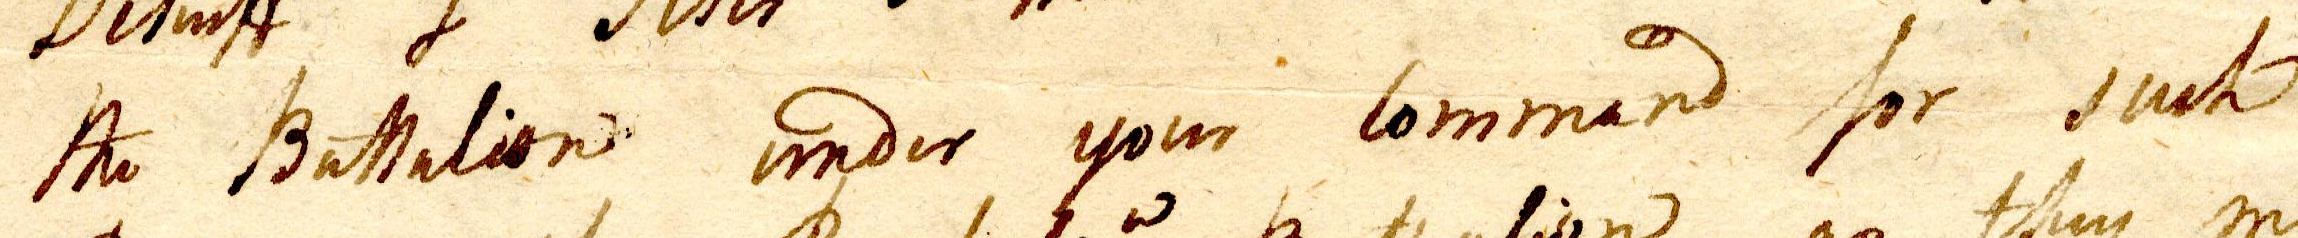the Battalion under your Command for such
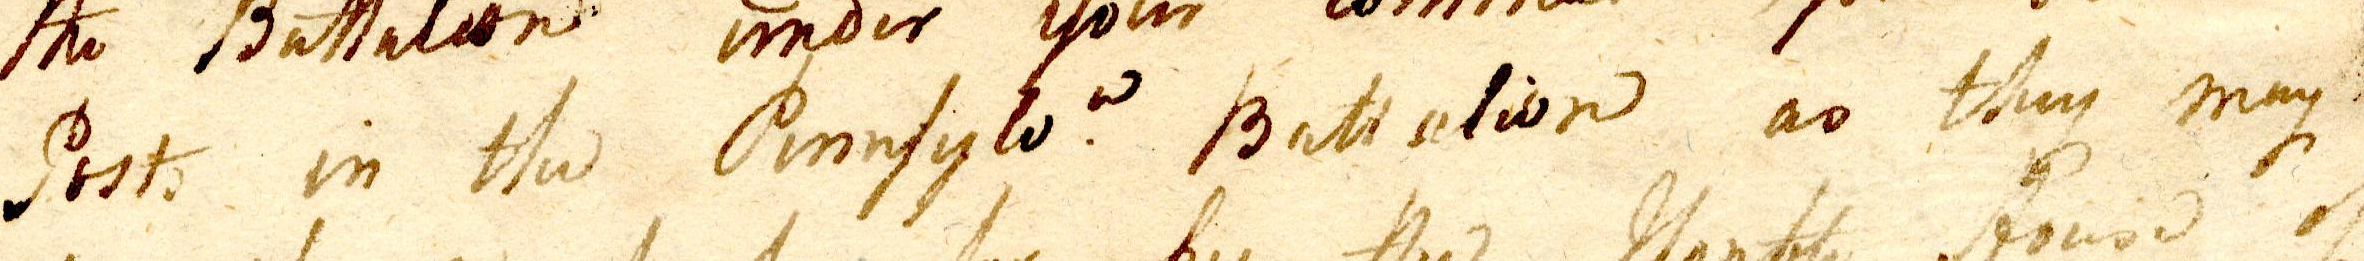Posts in the Pennsylv^a Battalion as they may
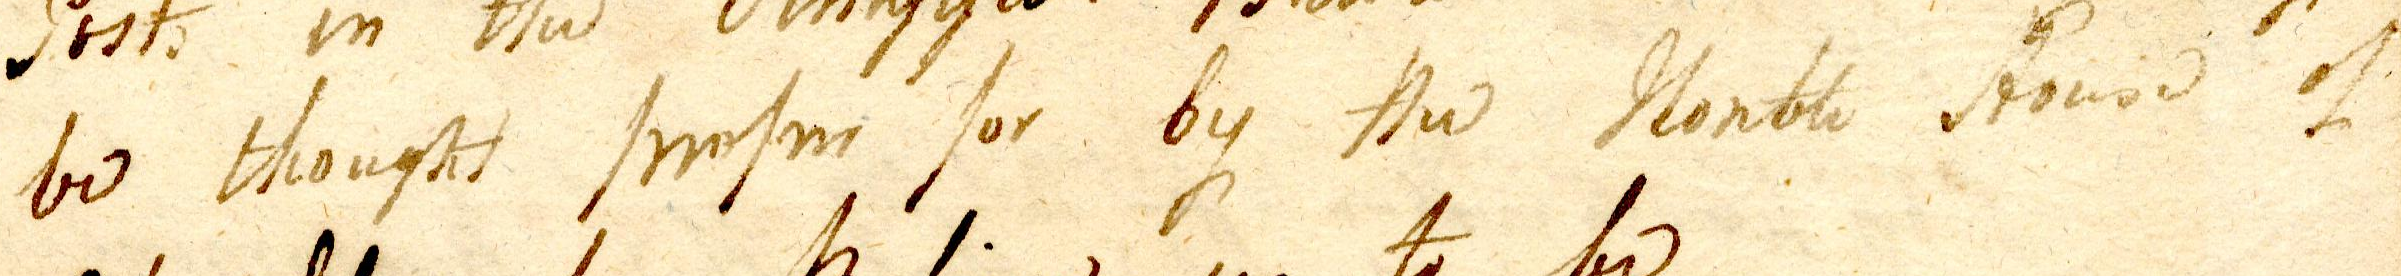be thought proper for by the Honble House of
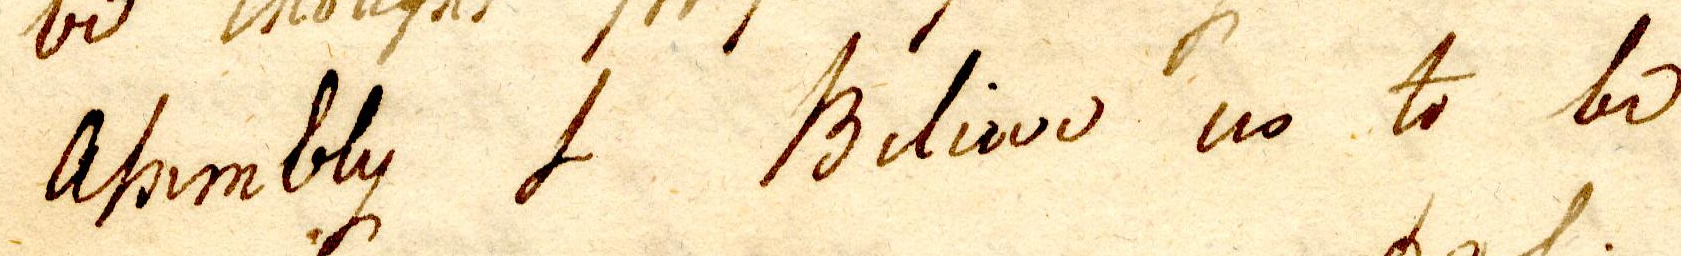Assembly I Believe us to be
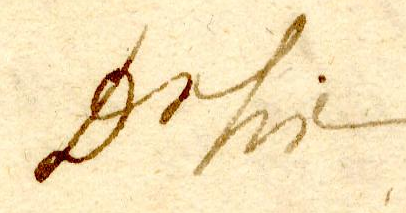D^r Sir
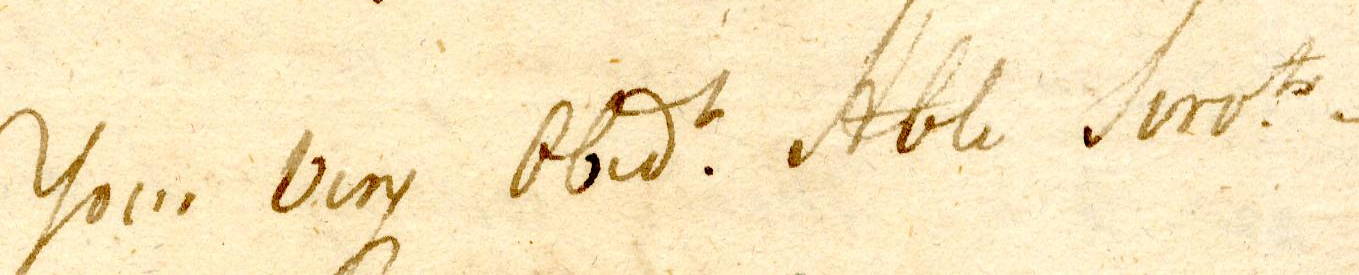Your Very Obed^t. Hble Serv^ts.
